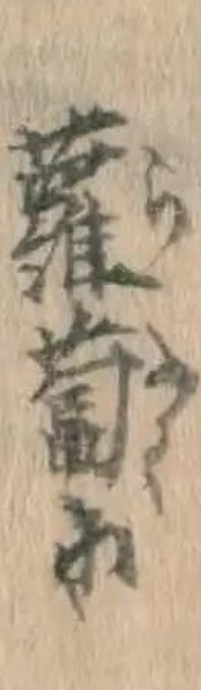蘿蔔に
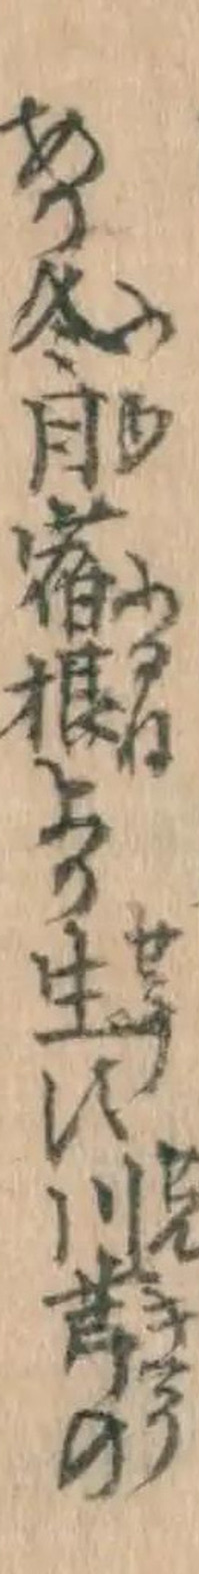あり冬月宿根より生す川芎の
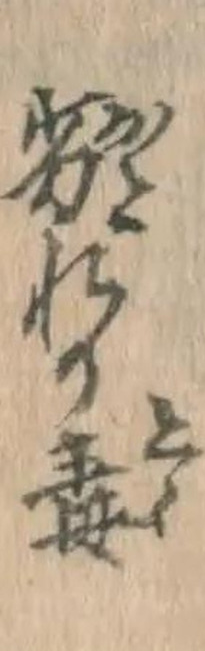劣れり毒
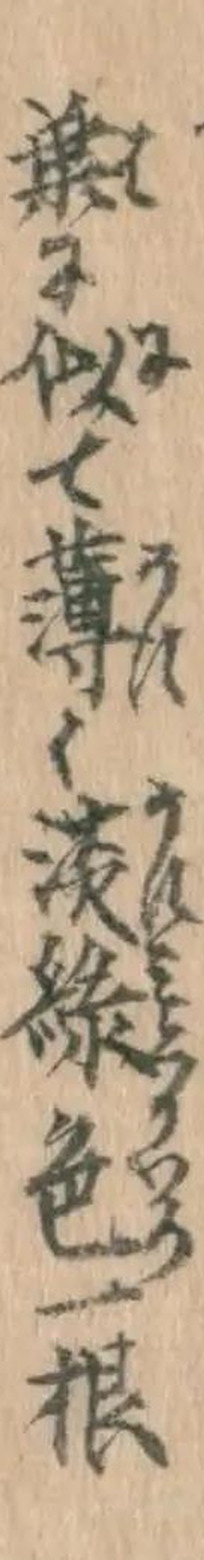葉に似て薄く淡緑色一根
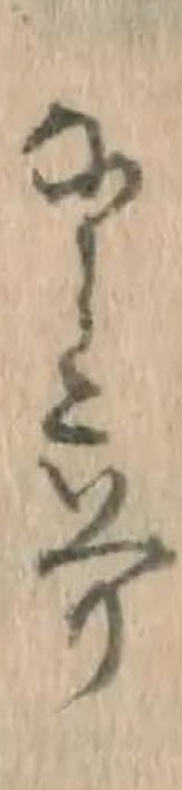なしといへり
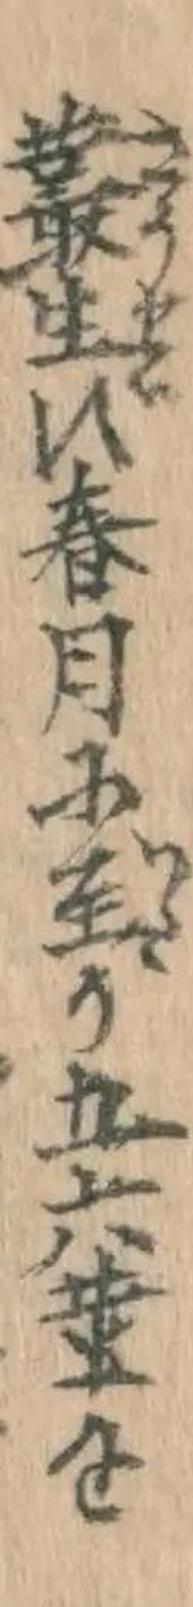叢生す春月に至り五六葉を
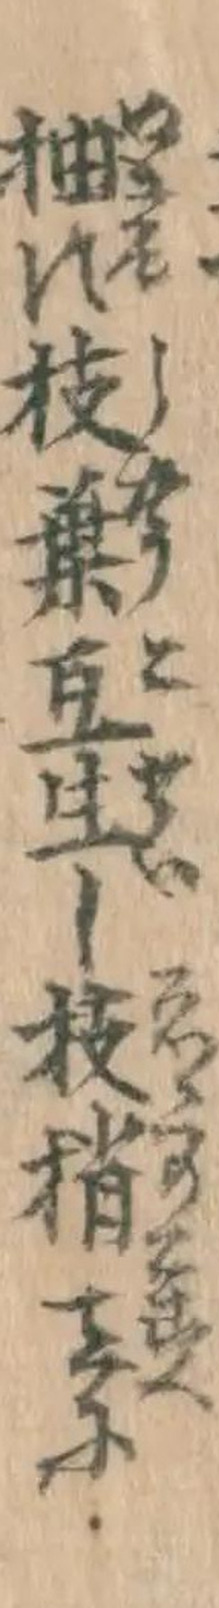抽す枝葉互生し枝梢ことに
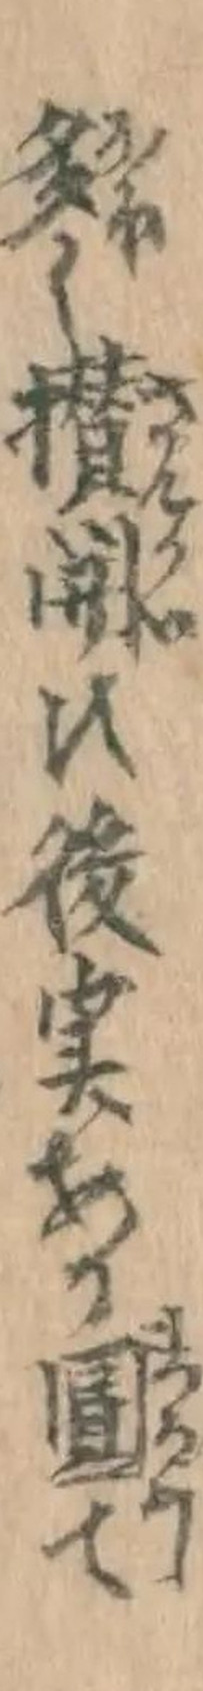多く攢開す後実あり円て
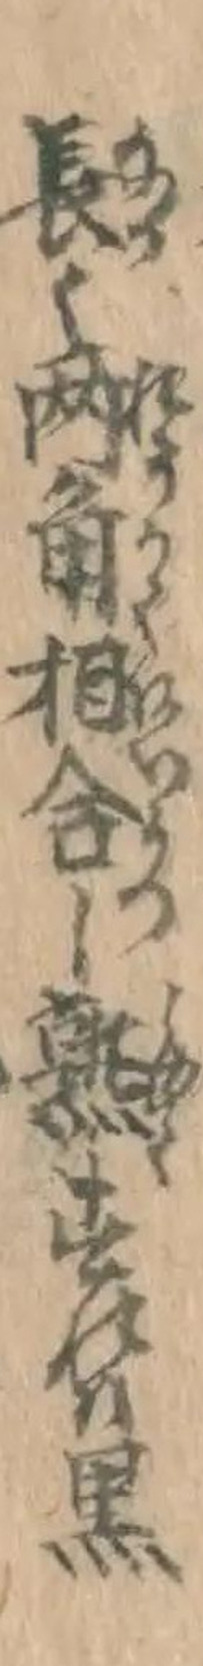長く両角相合し熟すれは黒
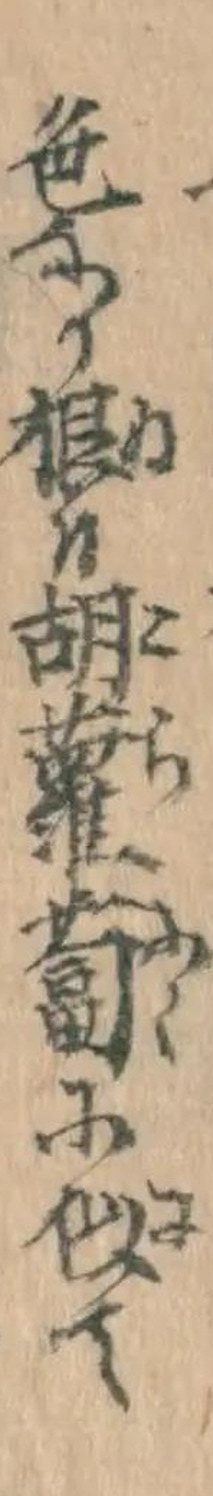色なり根は胡蘿蔔に似て

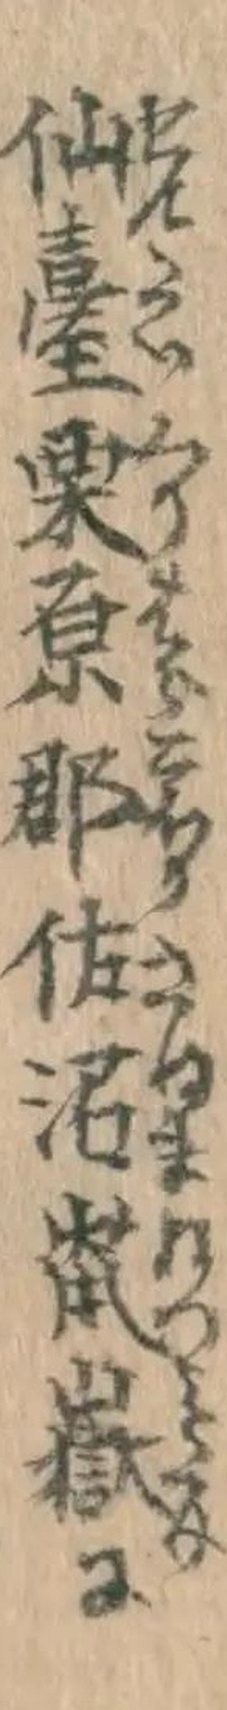仙台栗原郡佐沼鼠岳に
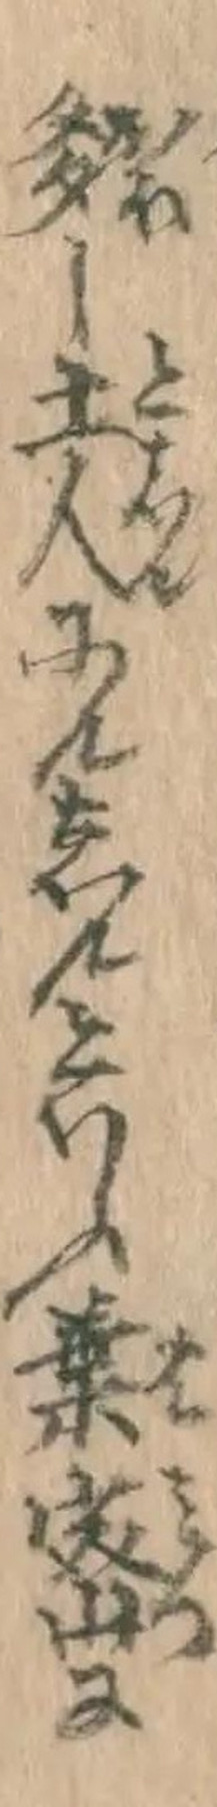多し土人にんしんといふ葉密に
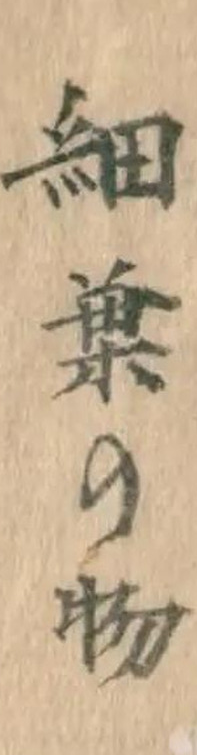細葉の物
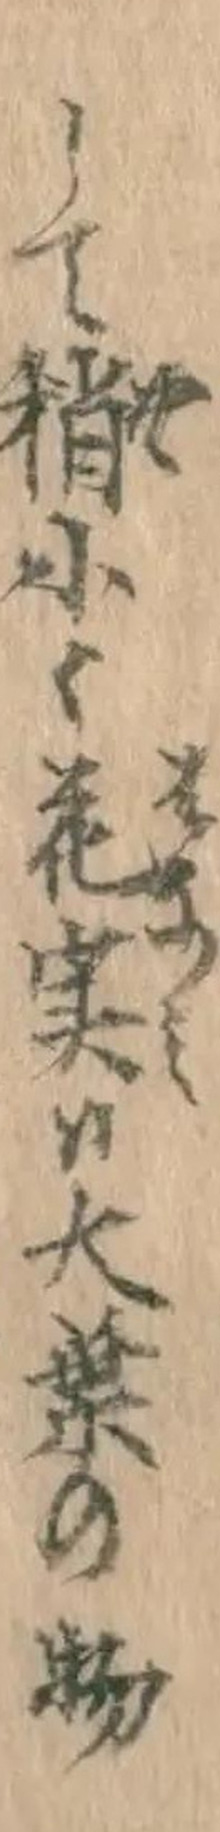して稍小く花実は大葉の物
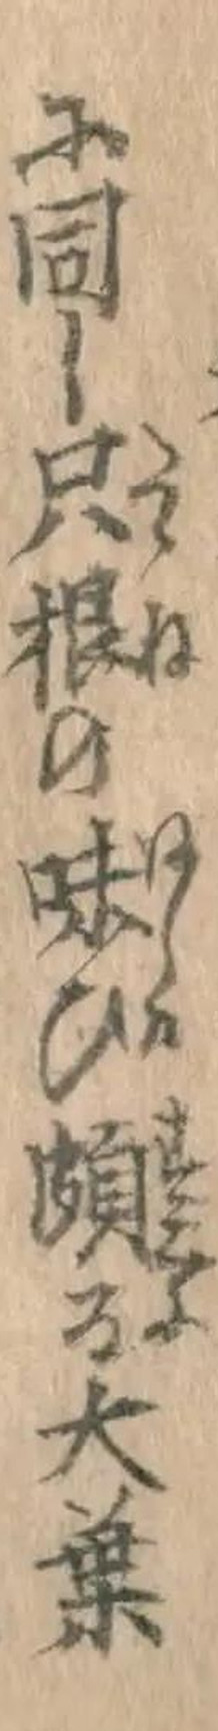に同し只根の味ひ頗る大葉
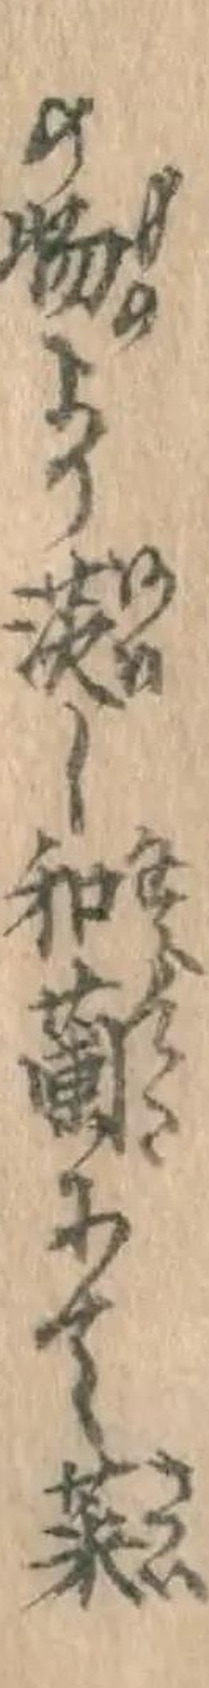の物より淡し和蘭にて菜
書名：本草図譜. 巻46-48
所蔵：国立国会図書館 National Diet Library, JAPAN
